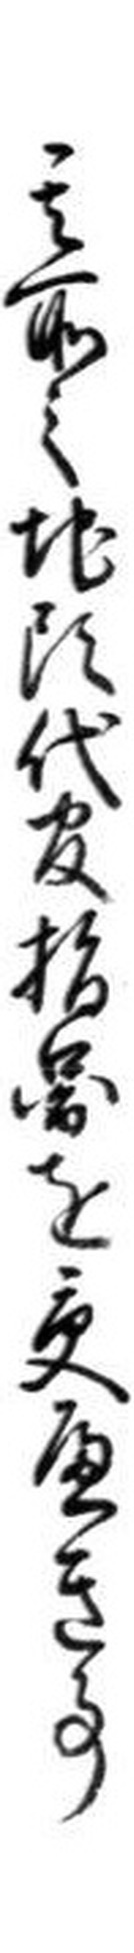其所之地頭代官指図を受へき事
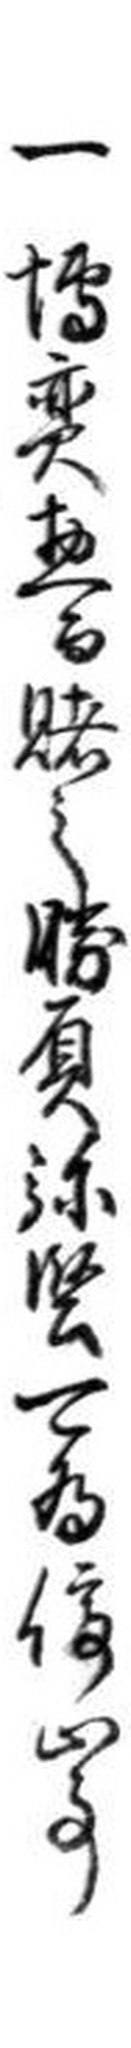一博奕惣而賭之勝負弥堅可為停止事
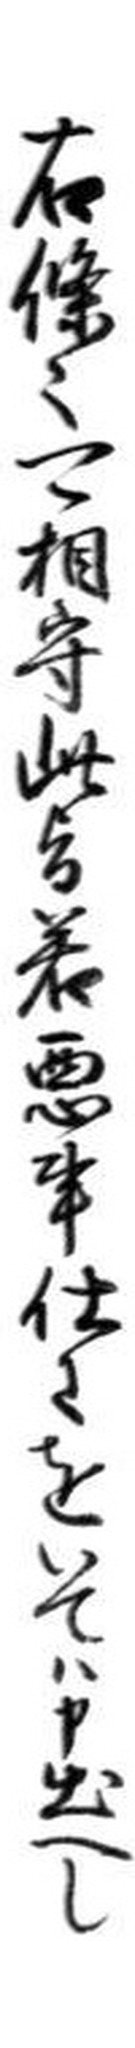右条々可相守此旨若悪事仕にをいてハ申出へし
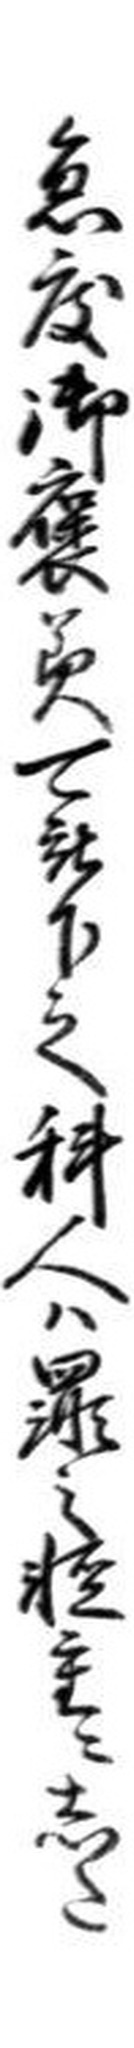急度御褒美可被下之科人ハ罪之軽重ニした
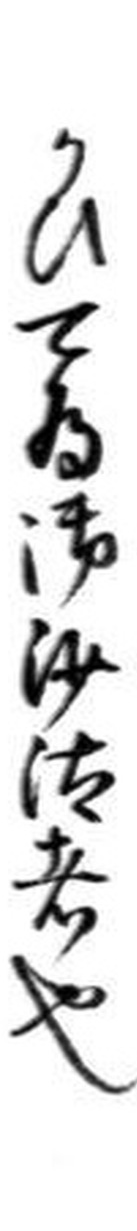かひて可為御沙汰者也
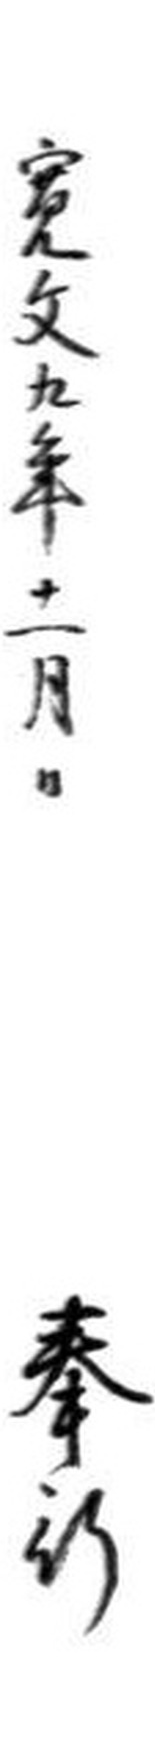寛文九年十一月日奉行
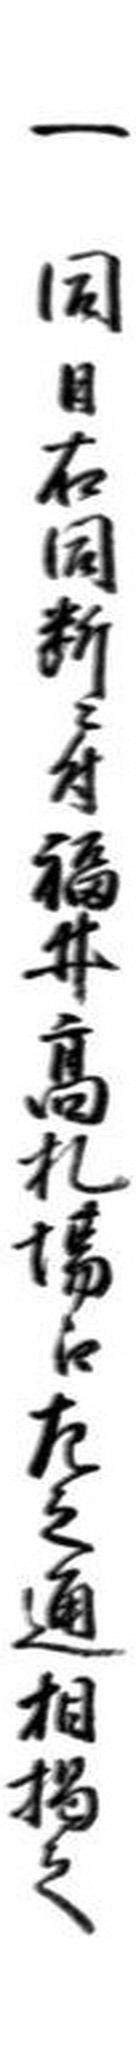一同日右同断ニ付福井高札場江左之通相掲之
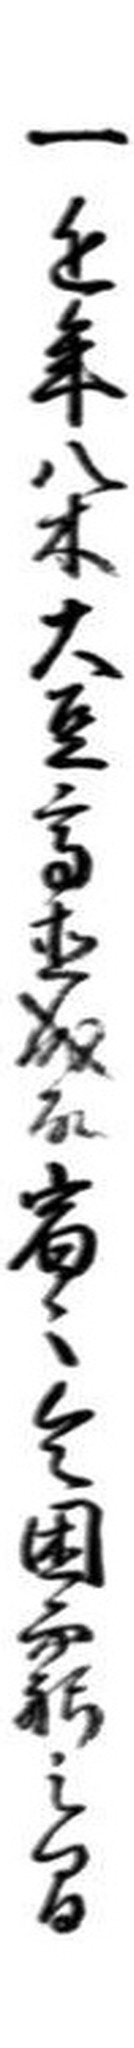一近年八木大豆高直成故宿々令困窮之間
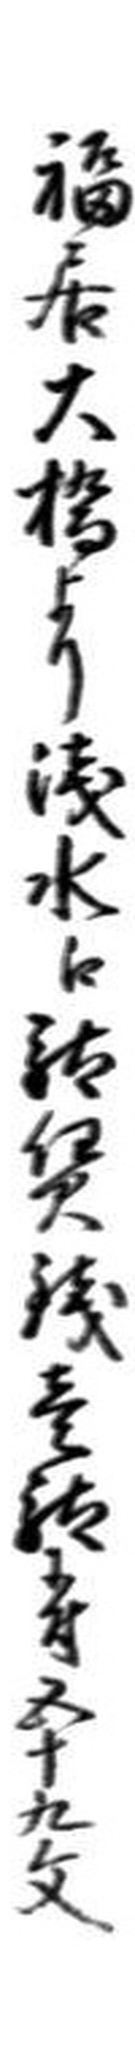福居大橋より浅水江駄賃銭壱駄に付五十九文
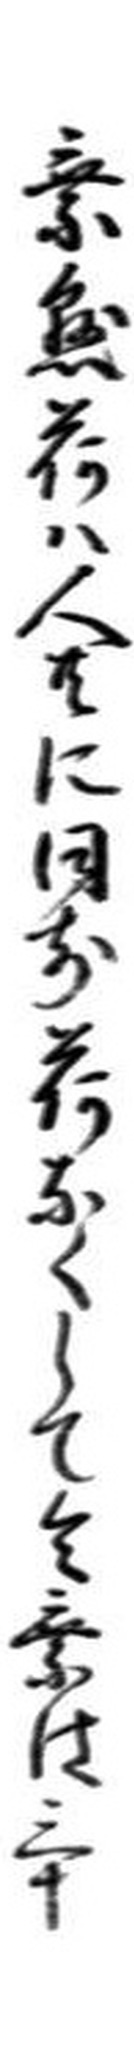乗懸荷ハ人共に同前荷なくして令乗は三十
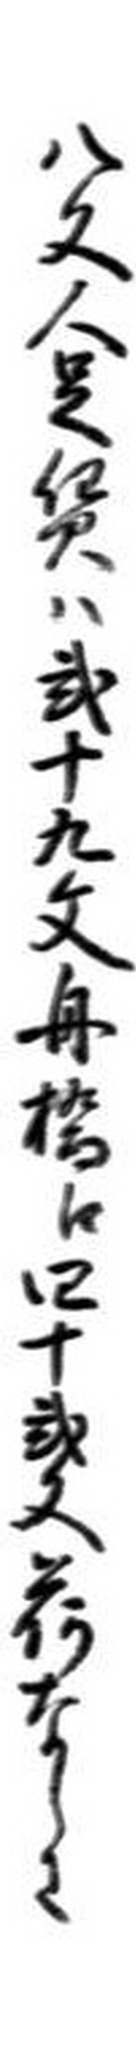八文人足賃ハ弐十九文舟橋江四十弐文荷なしに
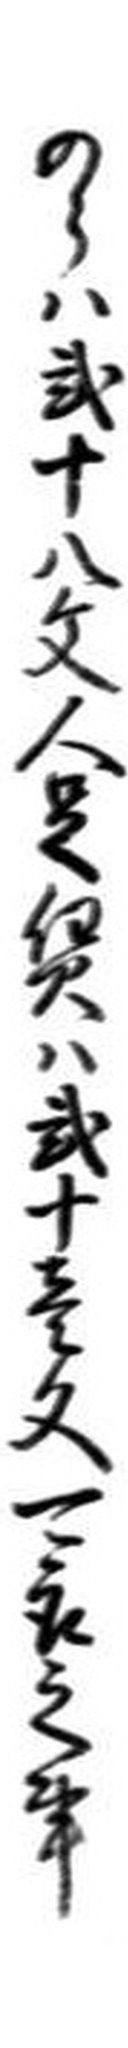のらハ弐十八文人足賃ハ弐十壱文可取之事
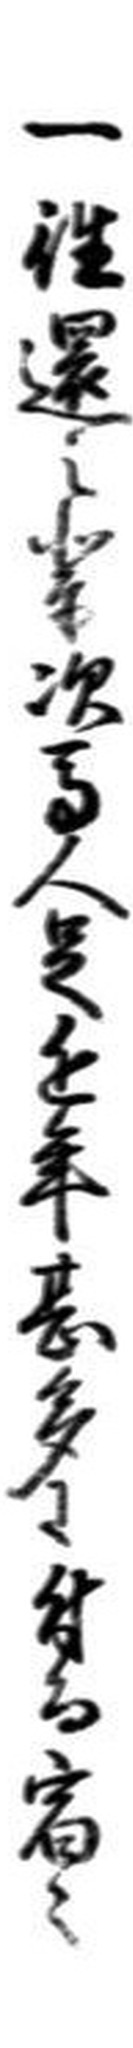一往還之輩次馬人足近年甚多に付而宿々
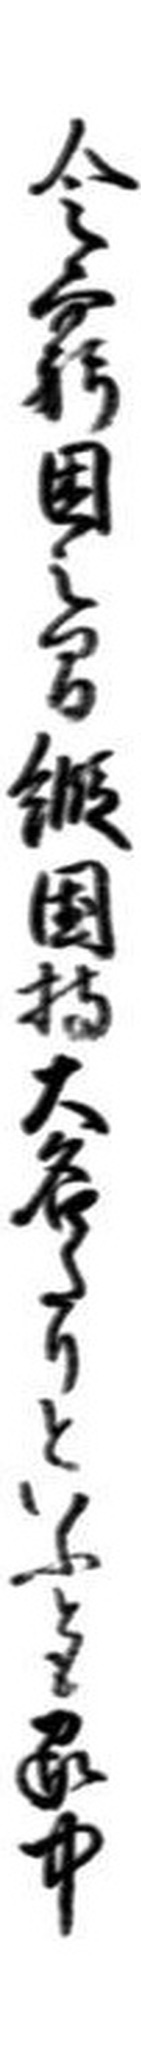令窮困之間縦国持大名たりといふとも家中

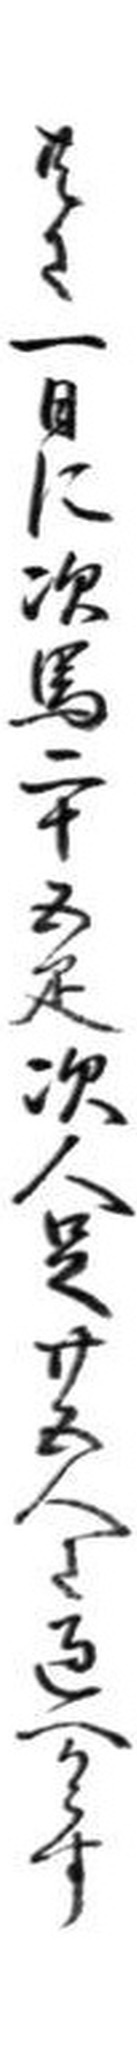共に一日に次馬二十五疋次人足廿五人に過へからす
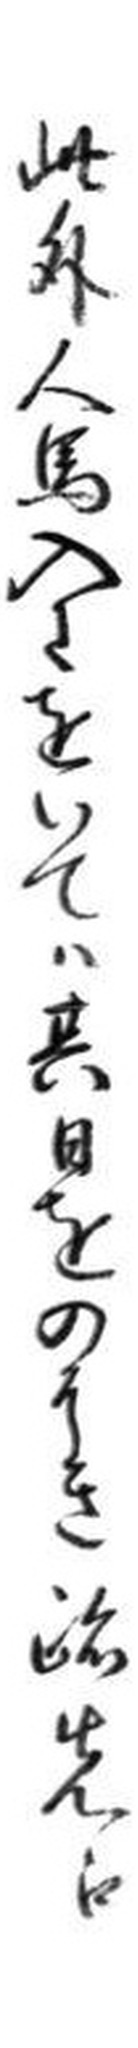此外人馬入にをいてハ其日をのそき跡先江
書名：家譜 七 光通公 従寛文四年到同九年
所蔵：福井県文書館 Fukui Prefectural Archives
